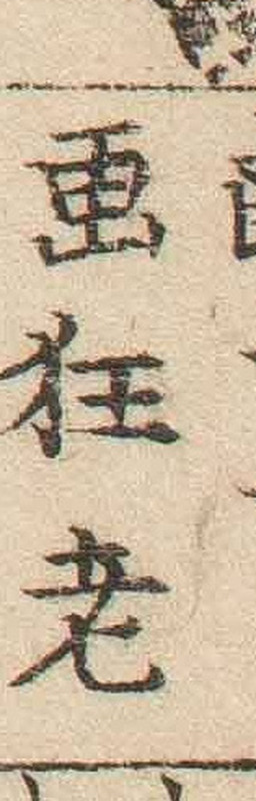画狂老

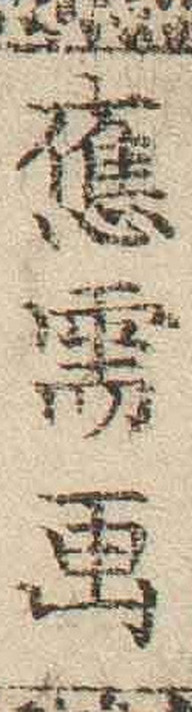應需画
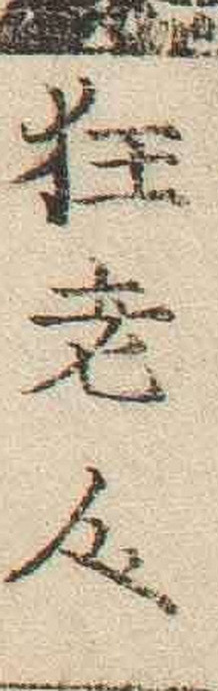狂老人

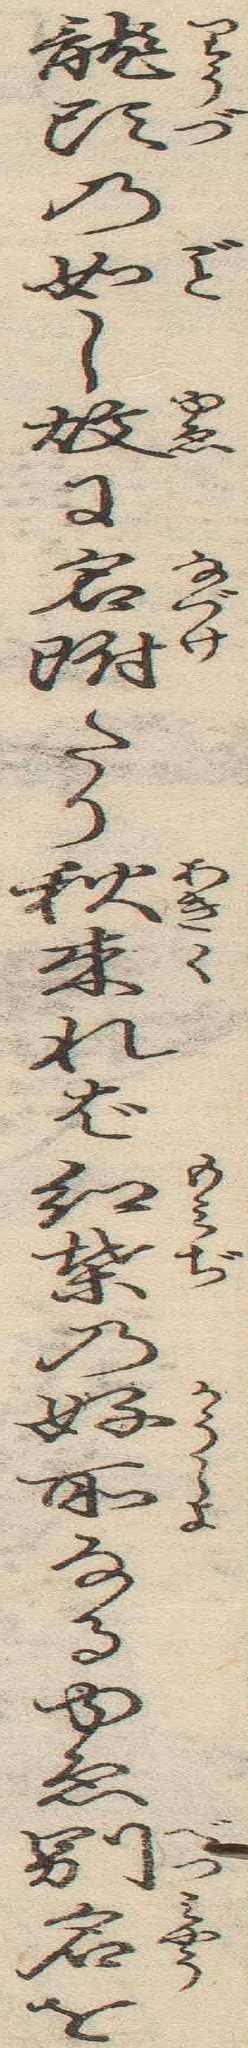龍頭の如し故に名附たり秋來れば紅葉の好所なるゆゑ別名を
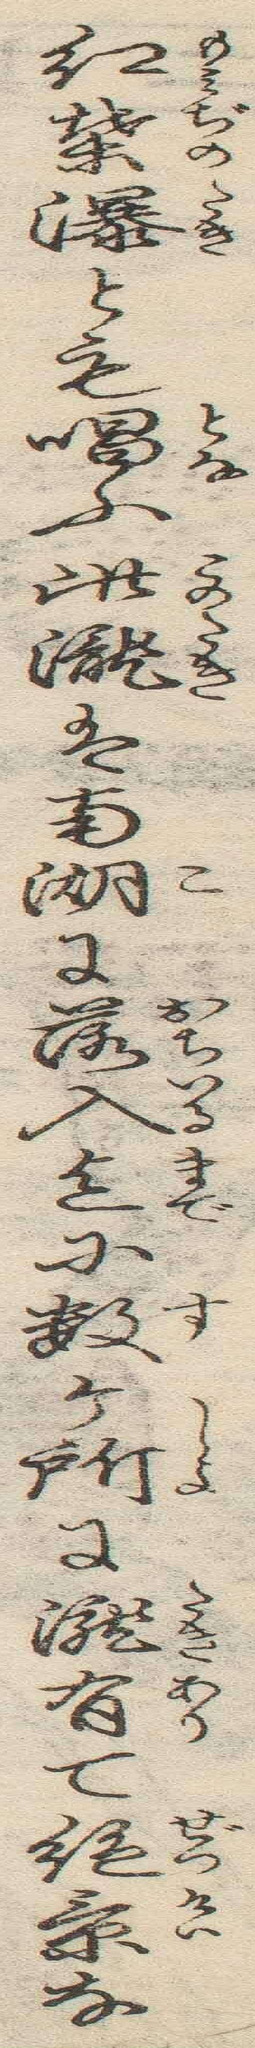紅葉瀑とも唱ふ此瀧は南湖に落入迄に数ヶ所に瀧有て絶景な
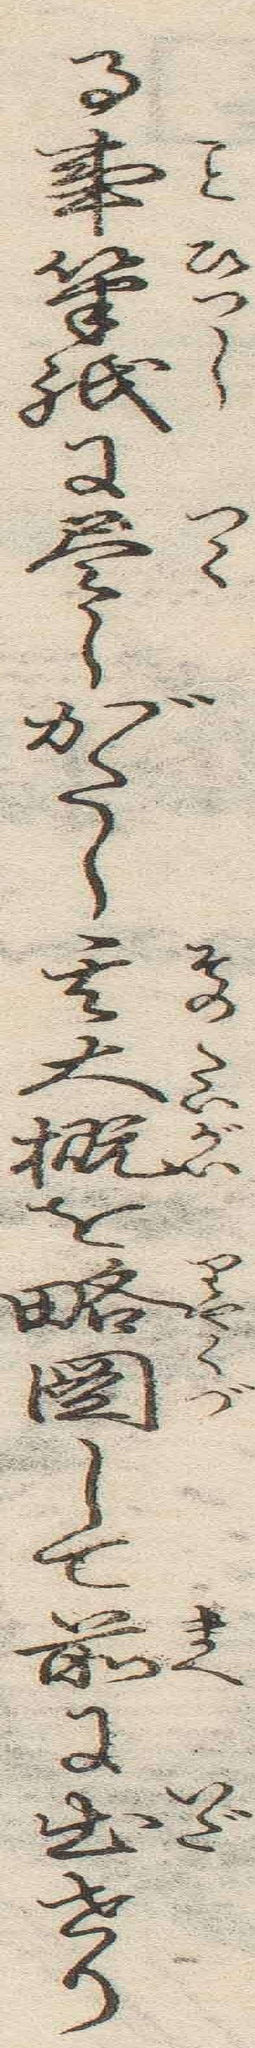る事筆紙に尽しがたし其大概を略圖して前に出せり
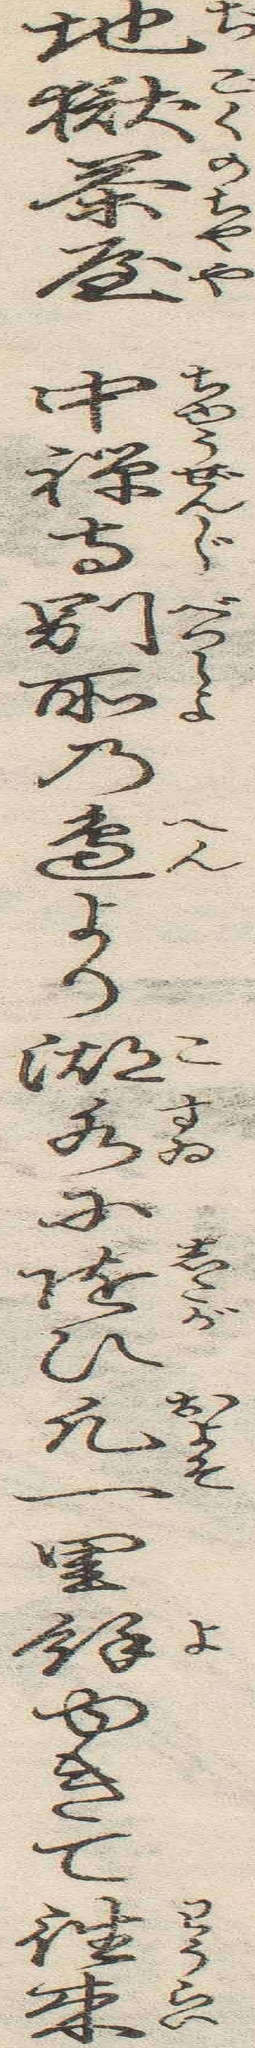地獄茶屋中禅寺別所の邊より湖水に随ひ凢一里餘ゆきて徃來
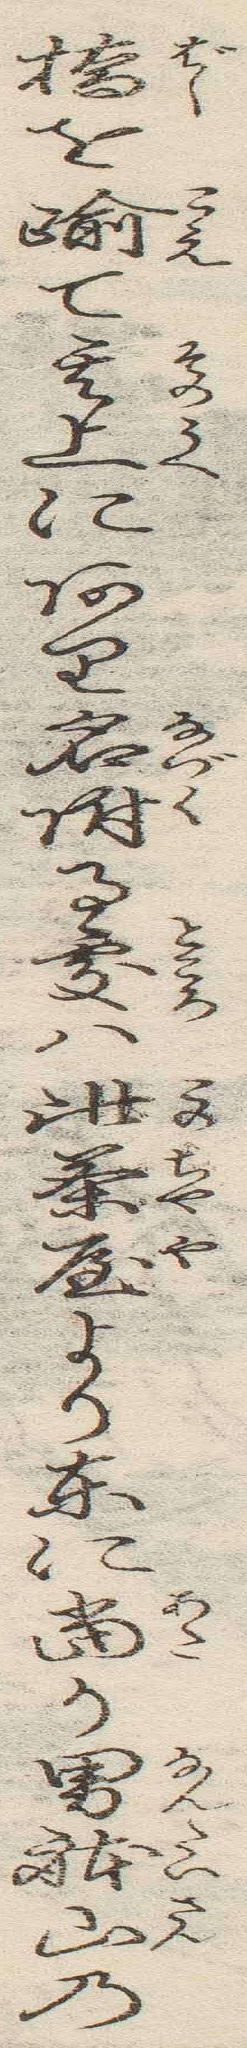橋を踰て其上にあり名附る處は此茶屋より東に當り男躰山の
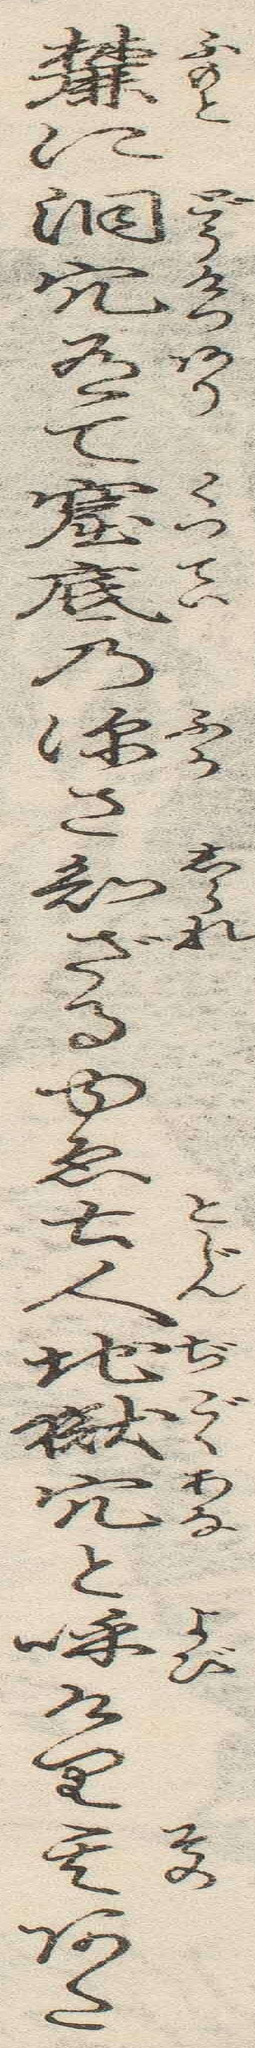麓に洞穴有て窟底の深さ知ざるゆゑ土人地獄穴と呼けり其あた
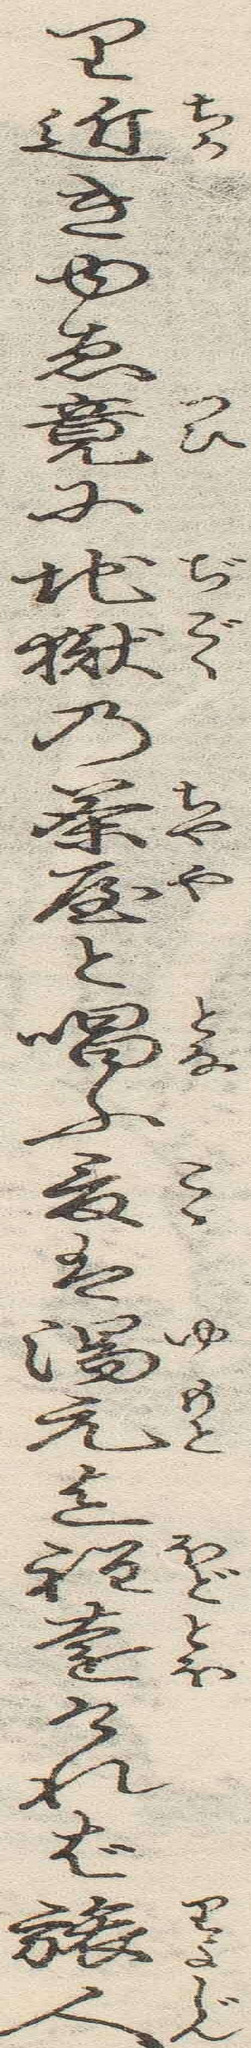り近きゆゑ竟に地獄の茶屋と唱ふ爰は湯元迄程遠ければ旅人
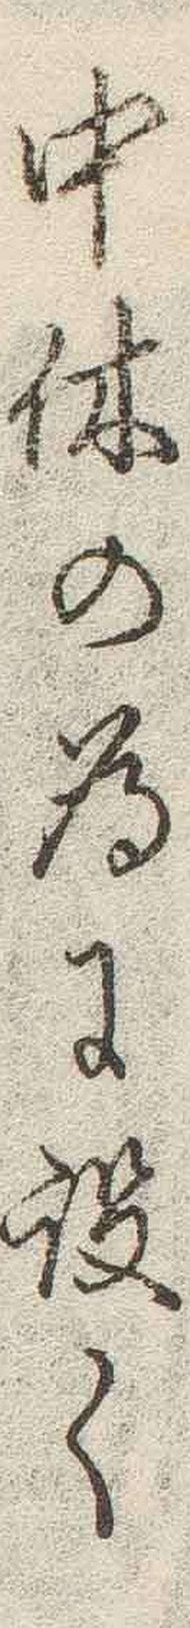中休の為に設く
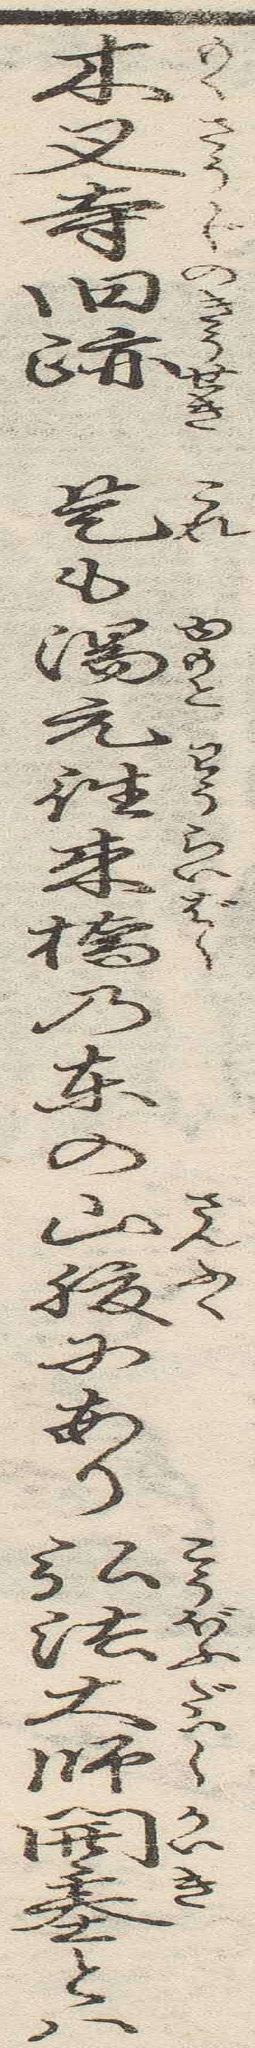木叉寺旧跡是も湯元徃來橋の東の山腹にあり弘法大師開基とは
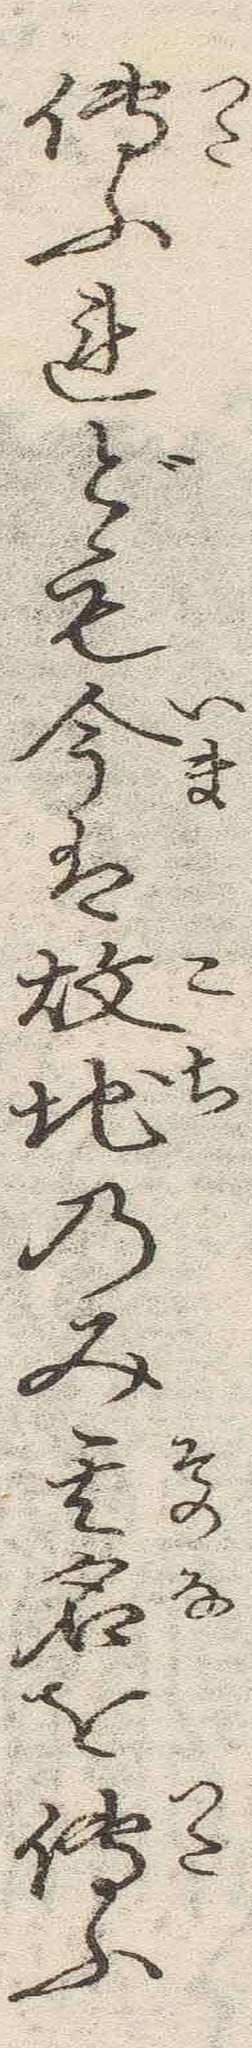傳ふれども今は故地のみ其名を傳ふ
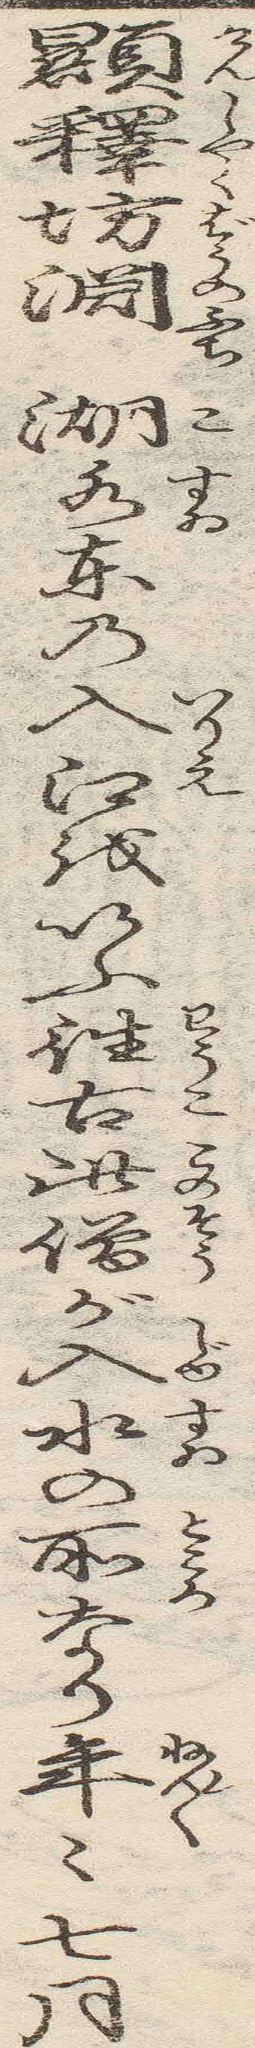顯釋坊淵湖水東の入江をいふ徃古此僧が入水の所なり年〻七月
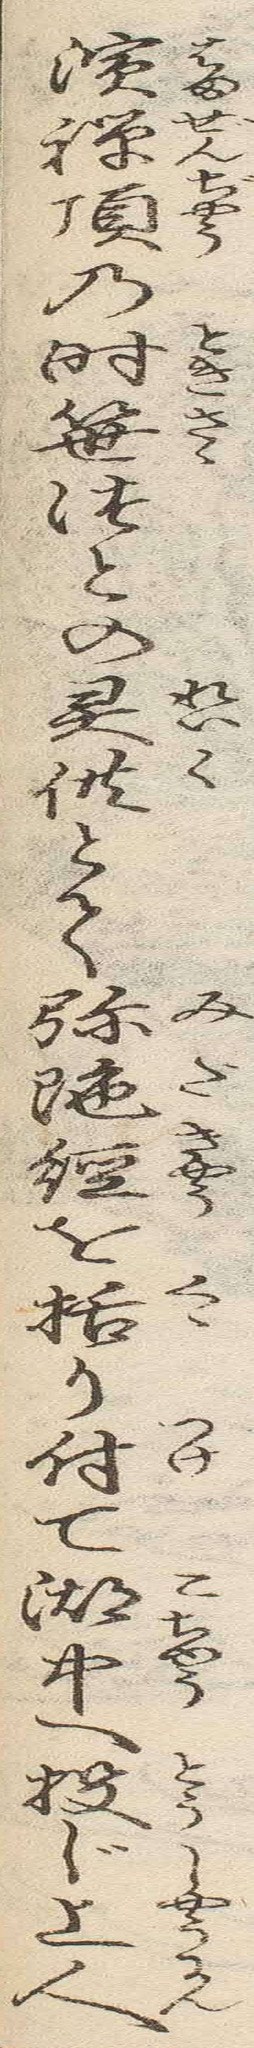濵禅頂の时笹つとの㚑供とて弥陀經を括り付て湖中へ投じ上人
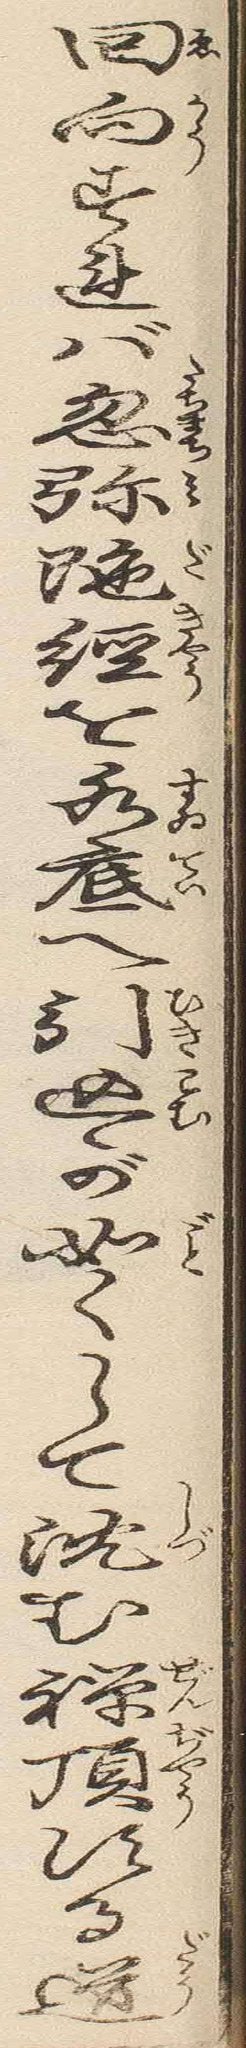囘向すれば忽弥陀經を水底へ引込が如くして沈む禅頂する道
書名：日光山志
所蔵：東京学芸大学附属図書館 国文学研究資料館
